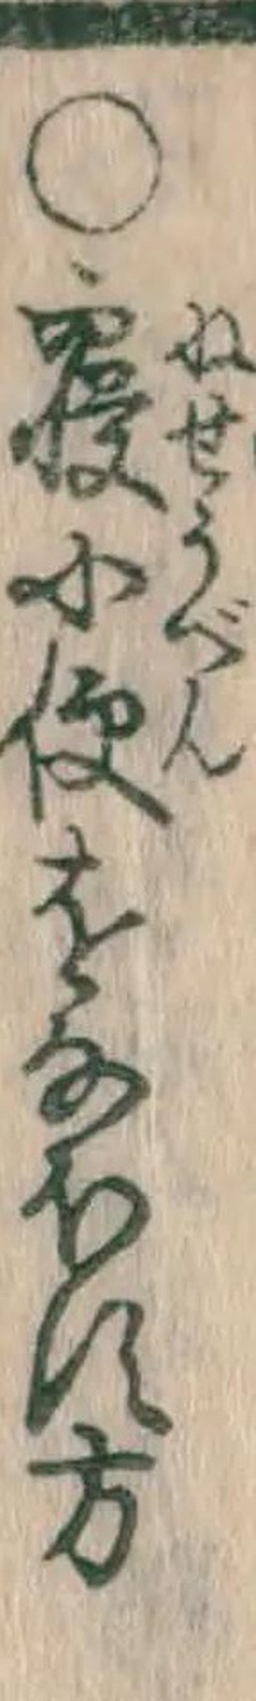○寝小便をなほす方
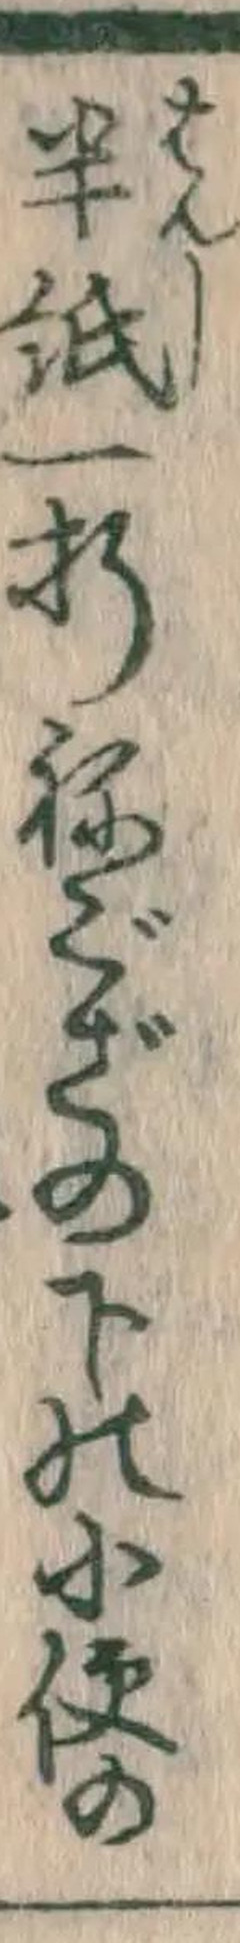半紙一折ねござの下の小便の
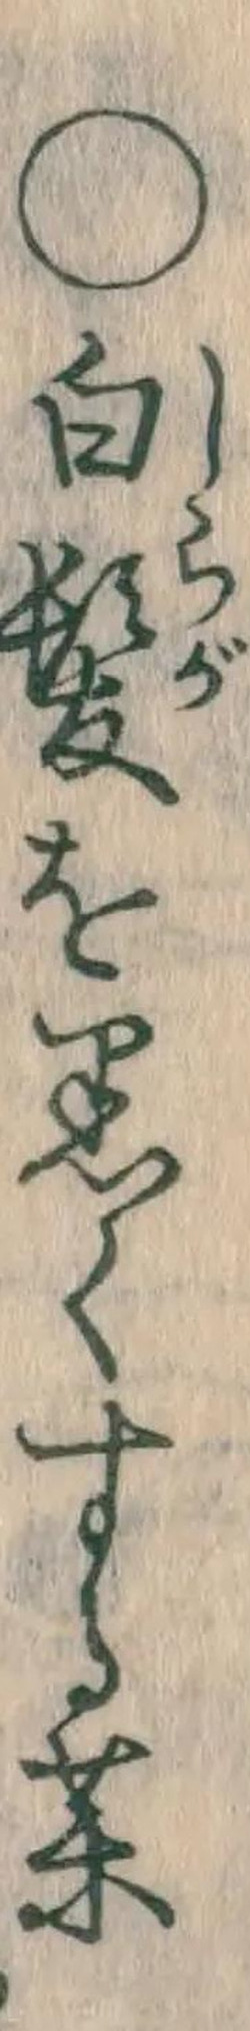○白髪を黒くする薬
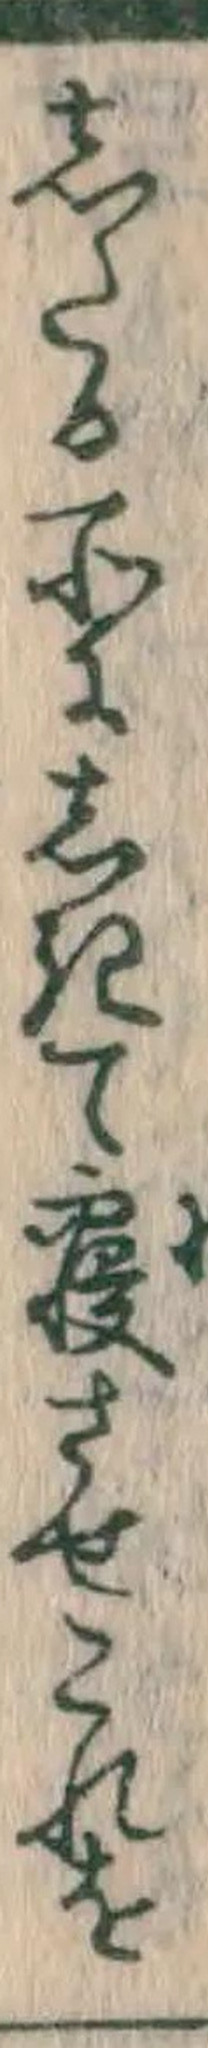したる所にしきて寝させこれを
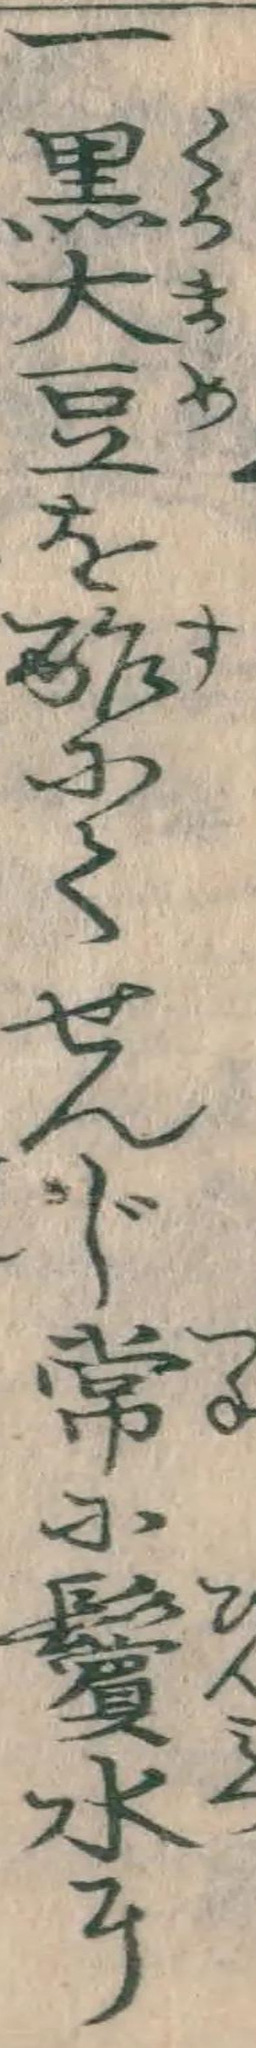一黒大豆を酢にてせんじ常に鬢水に
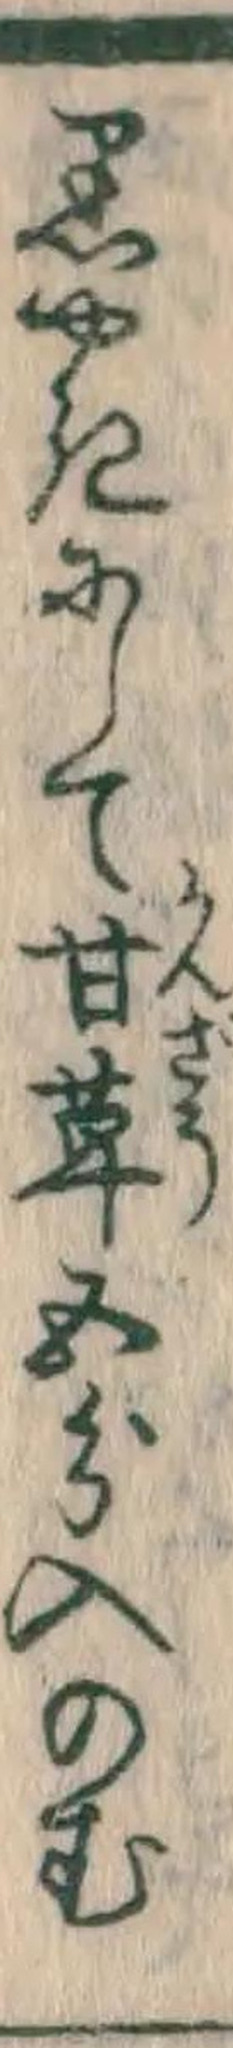黒やきにして甘草五分入のむ
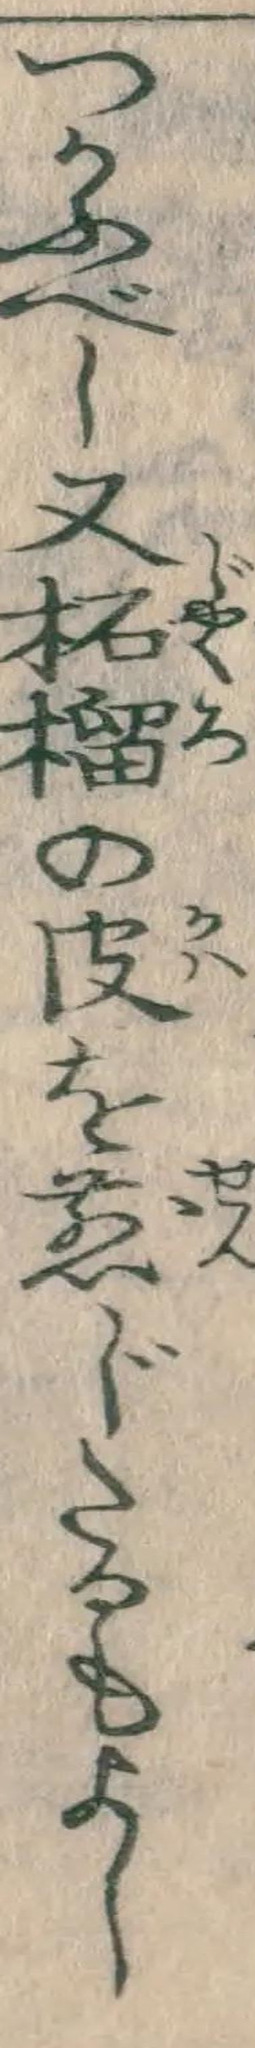つかふべし又柘榴の皮を煎じたるもよし
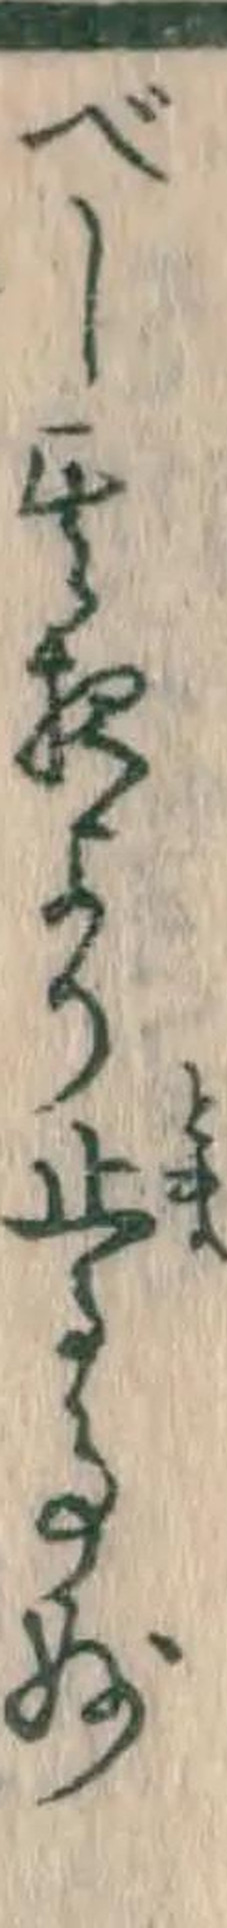べし其夜より止る事妙
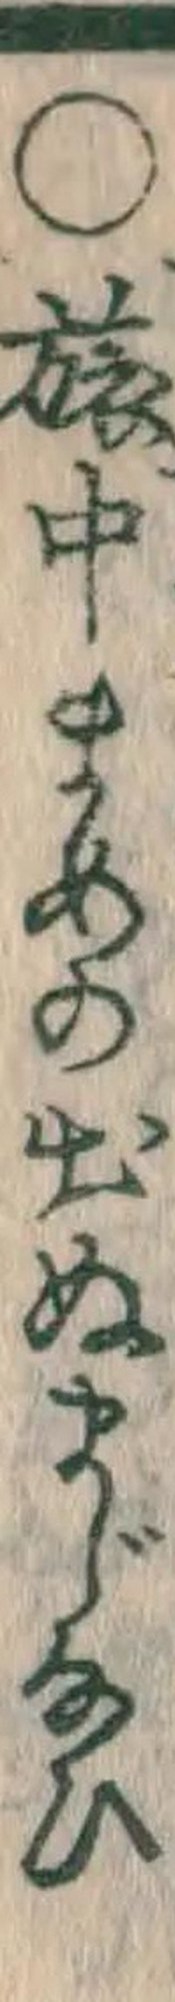○旅中まめの出ぬまじなひ
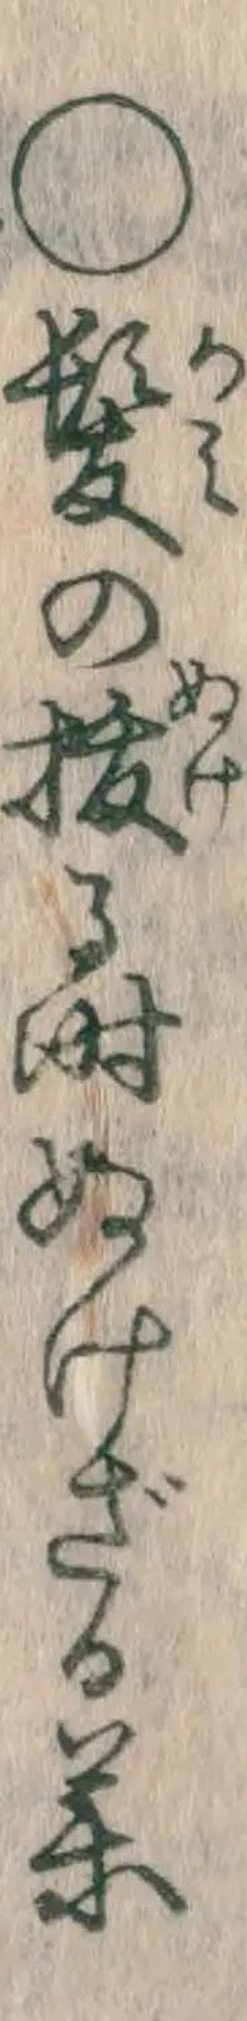○髪の抜る時ぬけざる薬
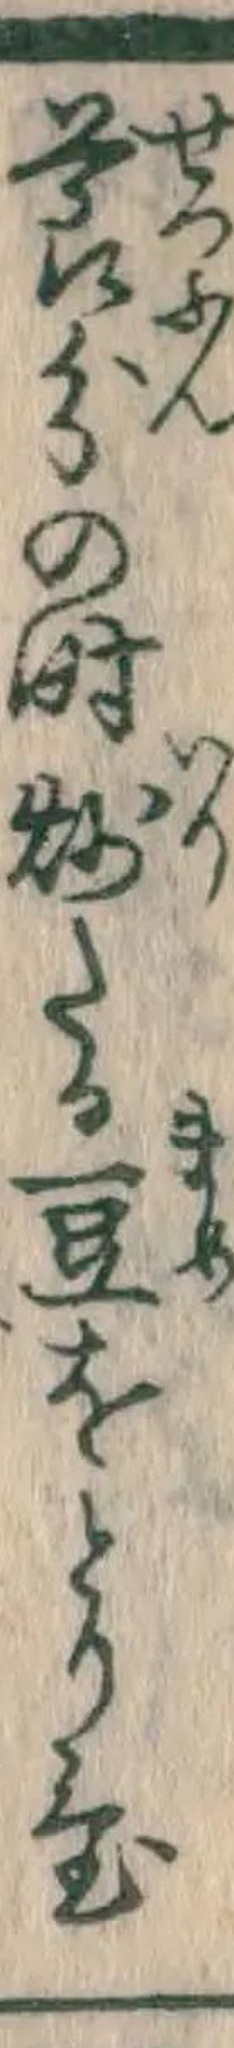節分の時炒たる豆をとり置
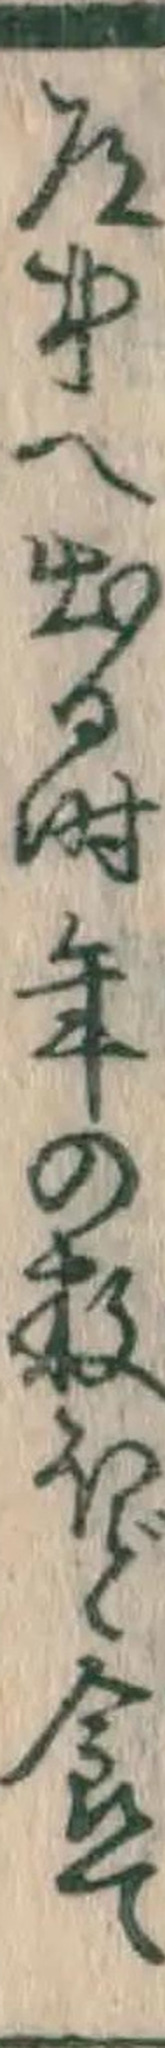道中へ出る時年の数など食て
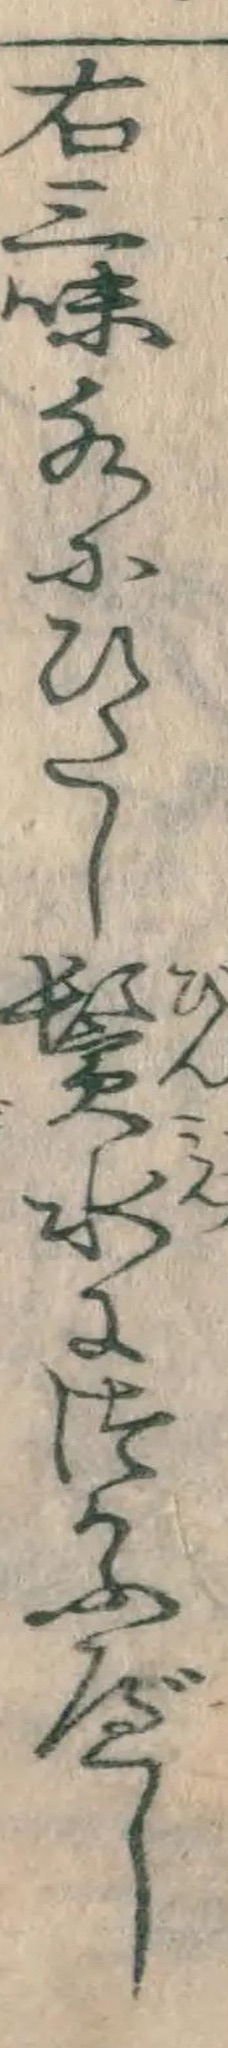右三味水にひたし鬢水につかふべし
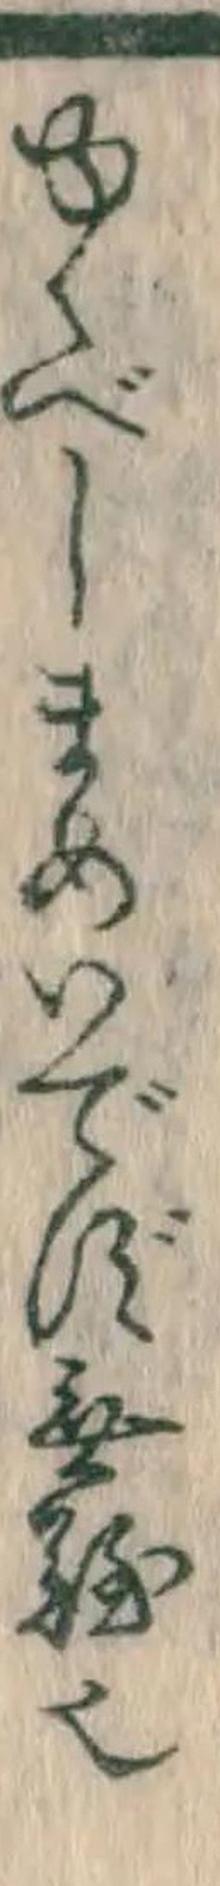ゆくべしまめいでず無難也
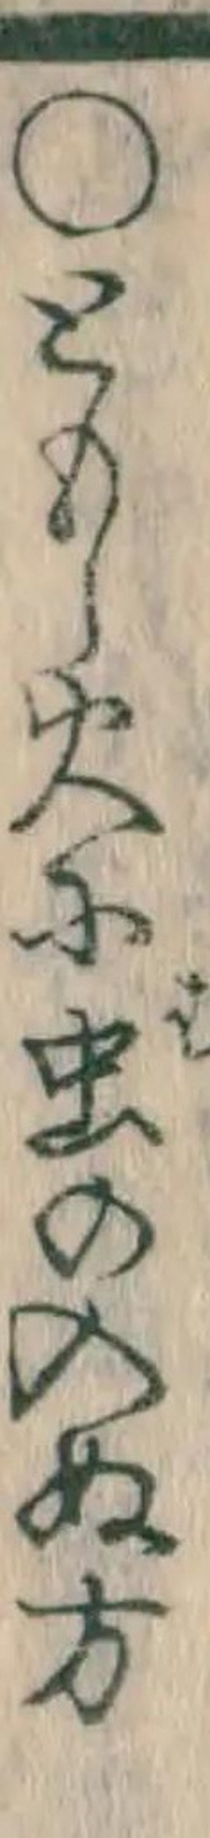○ともし火に虫の入ぬ方
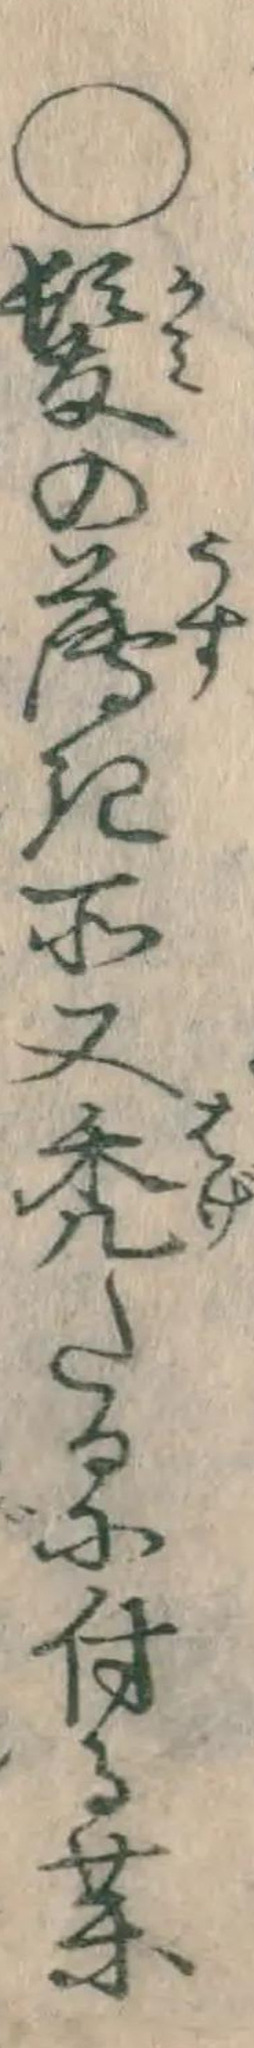○髪の薄き所又禿たるに付る薬
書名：広益秘事大全 3巻. [4]
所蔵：国立国会図書館 National Diet Library, JAPAN
